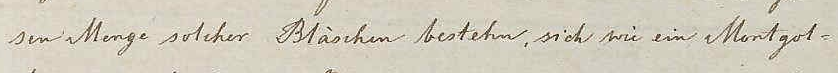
sen Menge solcher Bläschen bestehn, sich wie ein Montgol-
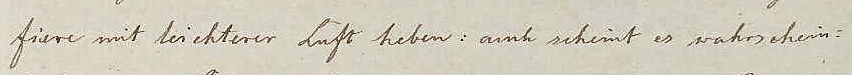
fiere mit leichterer Luft heben: auch scheint es wahrschein-
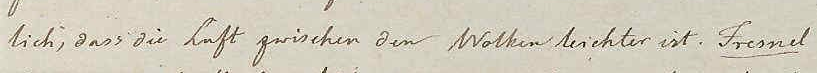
lich, dass die Luft zwischen den Wolken leichter ist. Fresnel
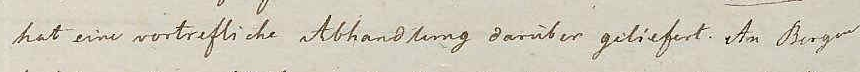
hat eine vortreffliche Abhandlung darüber geliefert. An Bergen
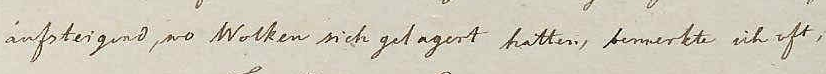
aufsteigend, wo Wolken sich gelagert hatten, bemerkte ich oft,
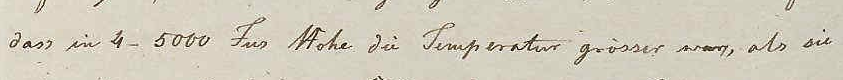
dass in 4–5000 Fus Höhe die Temperatur grösser war, als sie
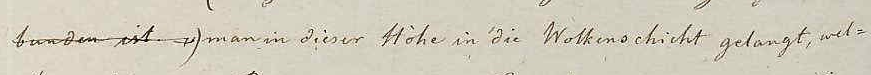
sein solte, weil man in dieser Höhe in die Wolkenschicht gelangt, wel-
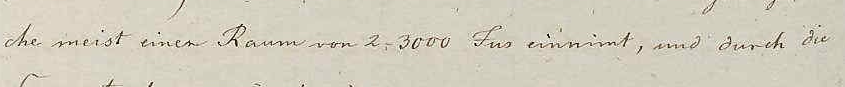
che meist einen Raum von 2–3000 Fus einnimt, und durch die
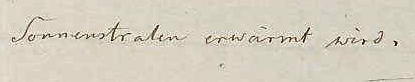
Sonnenstralen erwärmt wird.
